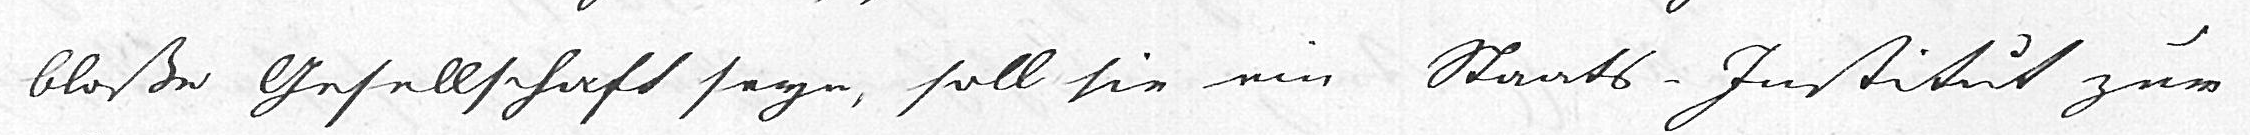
bloße Gesellschaft seyn, soll sie ein Staats-Institut zur
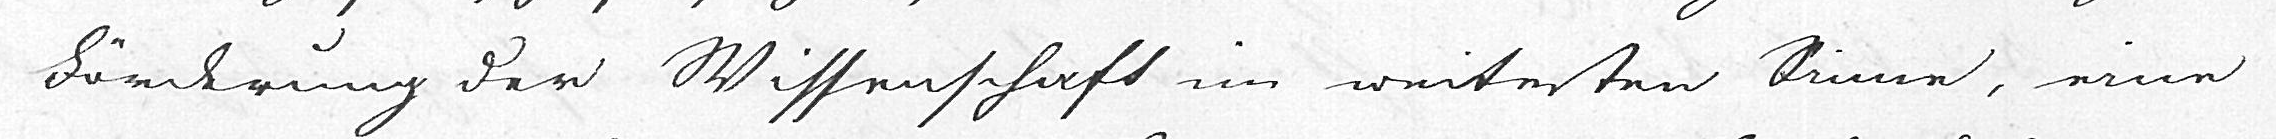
Förderung der Wissenschaft im weitesten Sinne, eine
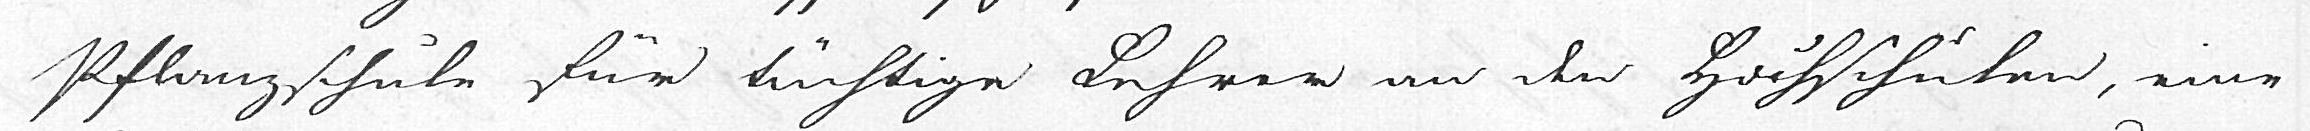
Pflanzschule für tüchtige Lehrer an den Hochschulen, eine
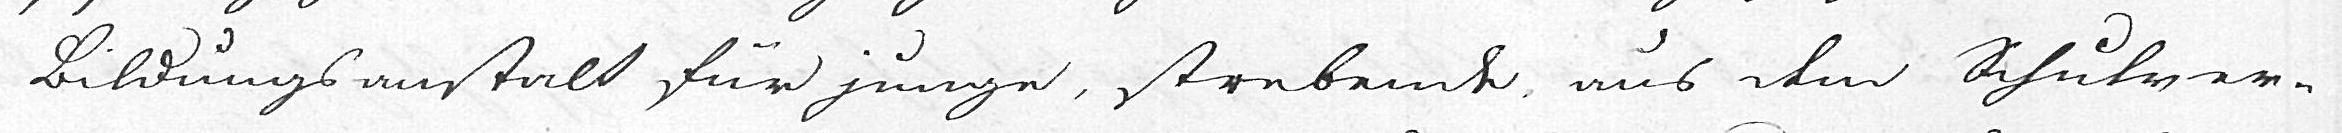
Bildungsanstalt für jungen, strebende, aus dem Schulver-
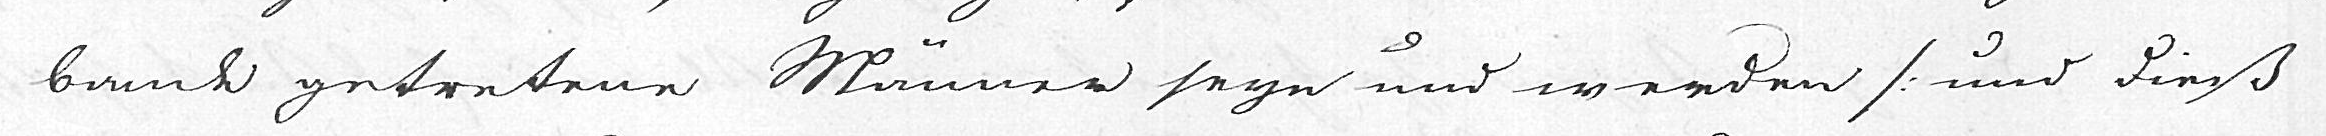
bande getretene Männer seyn und werden (und dieß
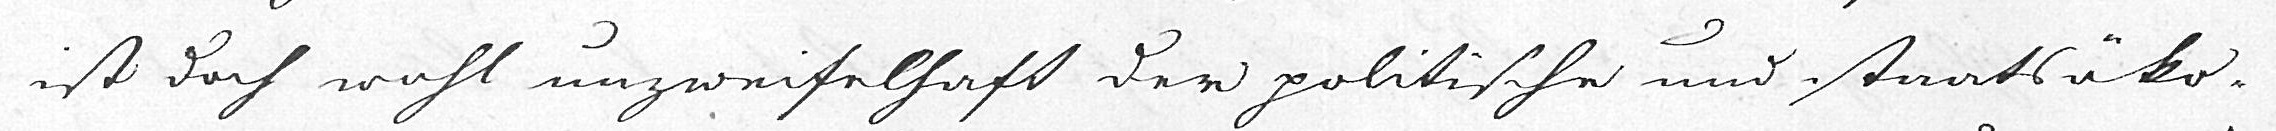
ist doch wohl unzweifelhaft der politische und staatsöko-
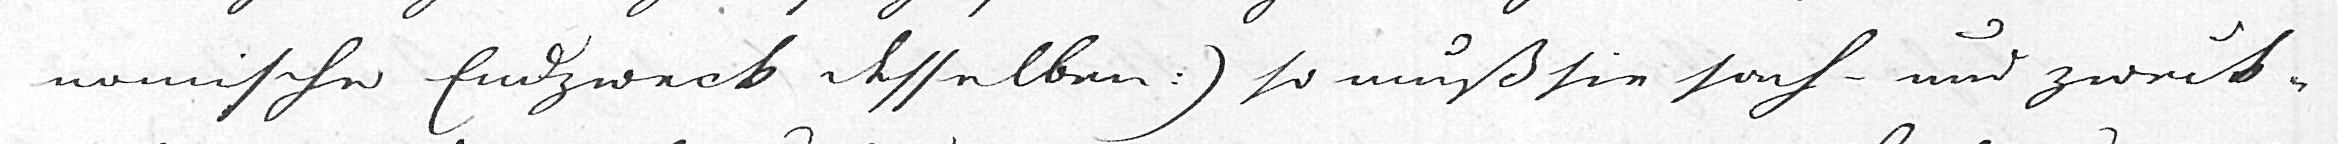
nomische Endzweck desselben) so muß sie sach- und zweck-
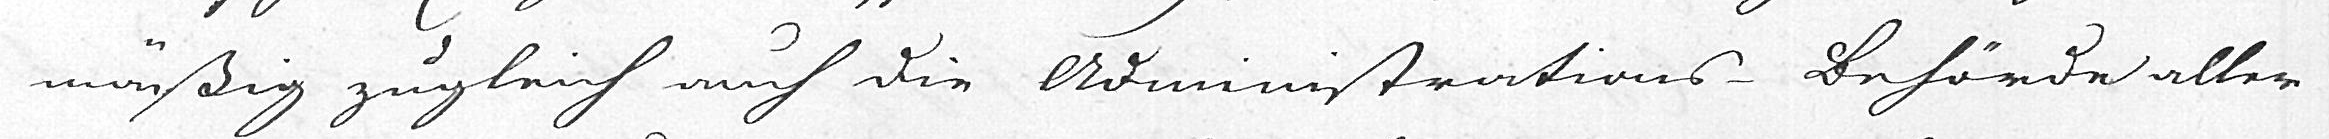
mäßig zugleich auch die Administrations-Behörde aller
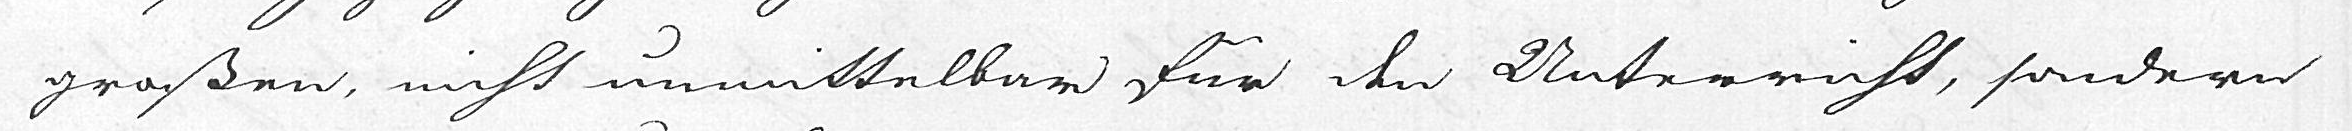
großen, nicht unmittelbar für den Unterricht, sondern
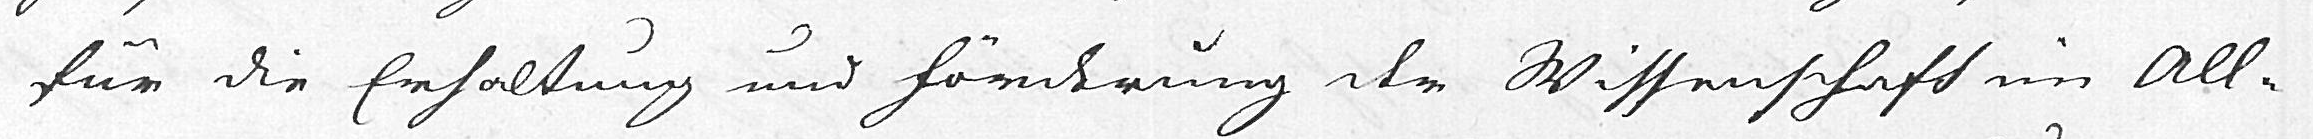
für die Erhaltung und Förderung der Wissenschaft im All-
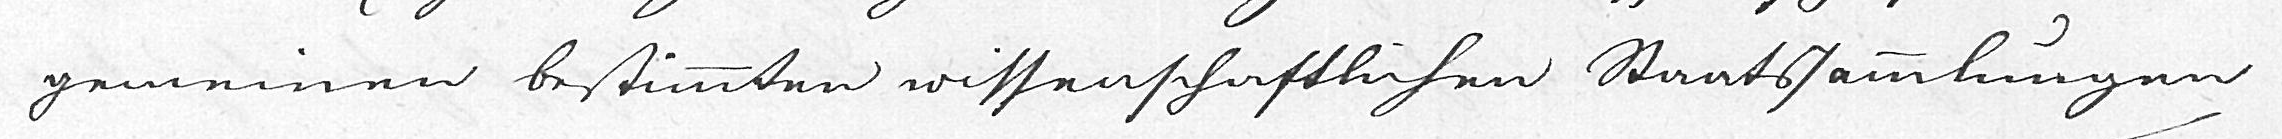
gemeinen bestimmte wissenschaftlichen Staatssammlungen
